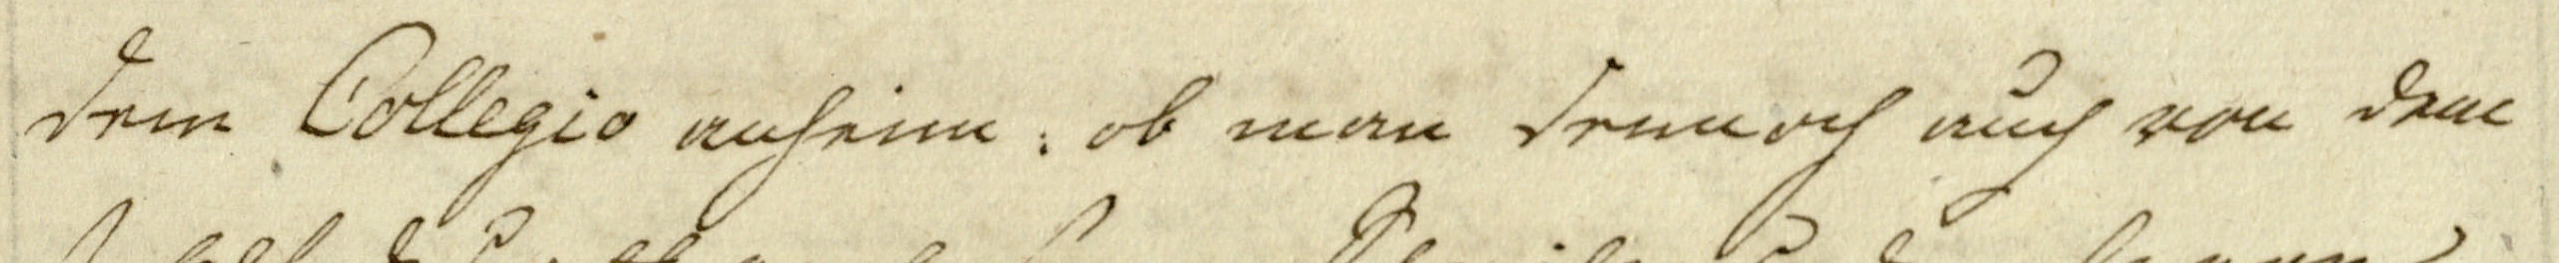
dem Collegio anheim, ob man dennoch auch von dem
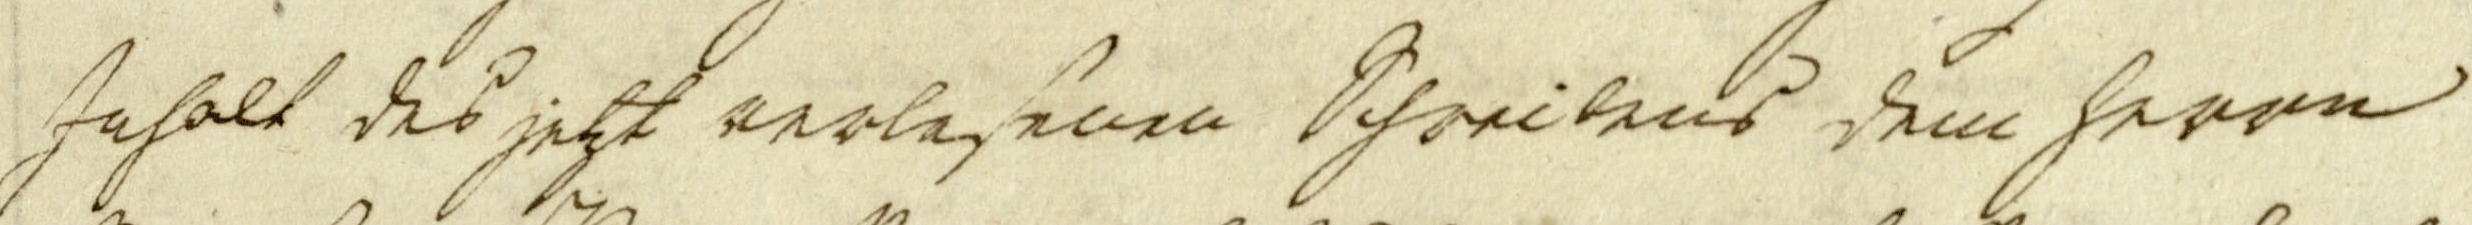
Inhalt des jetzt verlesenen Schreibens dem herrn
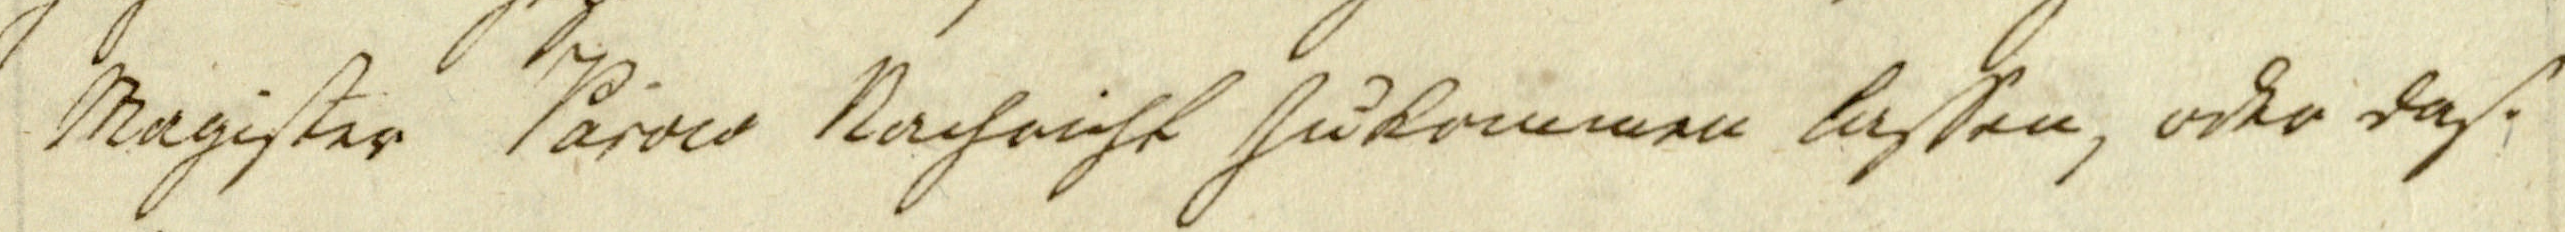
Magister Parow Nachricht zukommen lassen, oder das¬
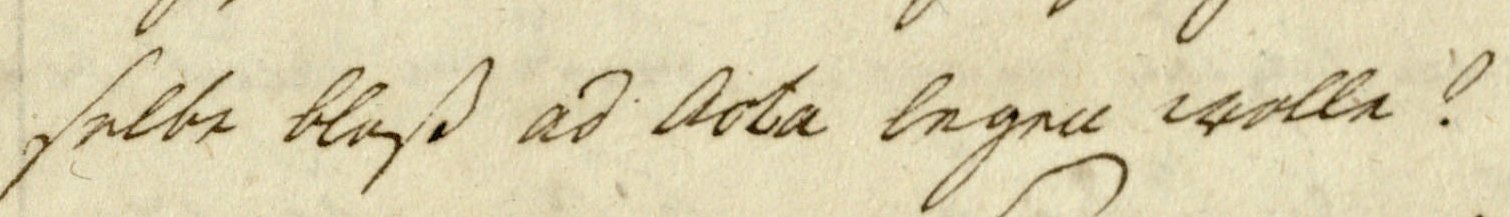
selbe bloß ad Acta legen wolle!
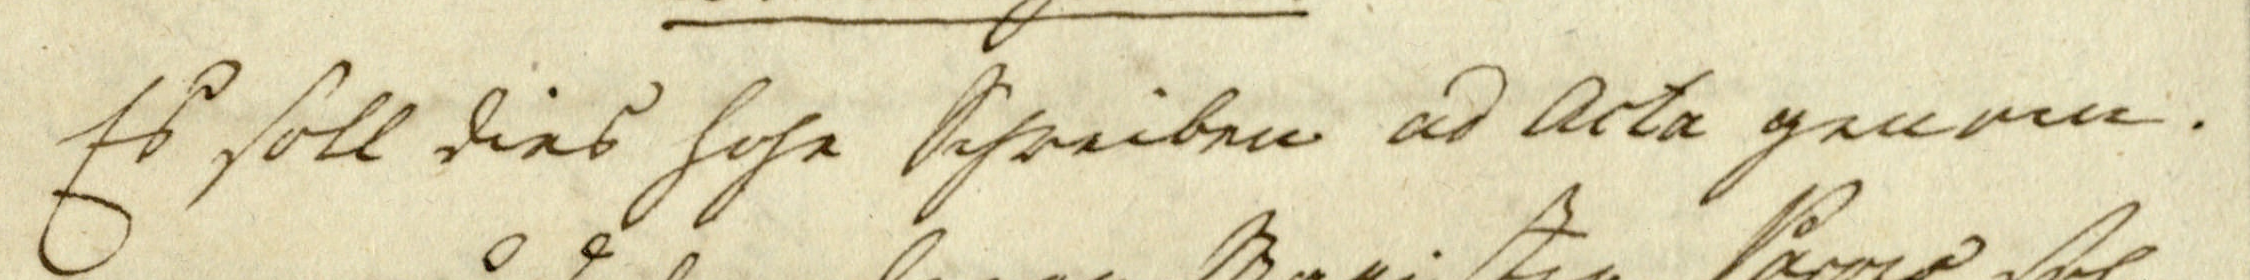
Es soll dies hohe Schreiben ad Acta genom¬
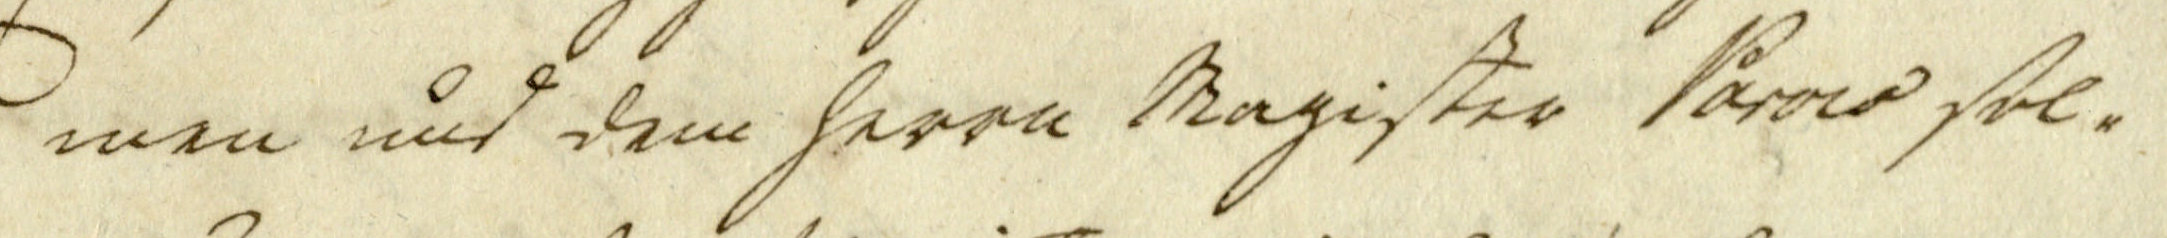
men und dem herrn Magister Parow sol¬
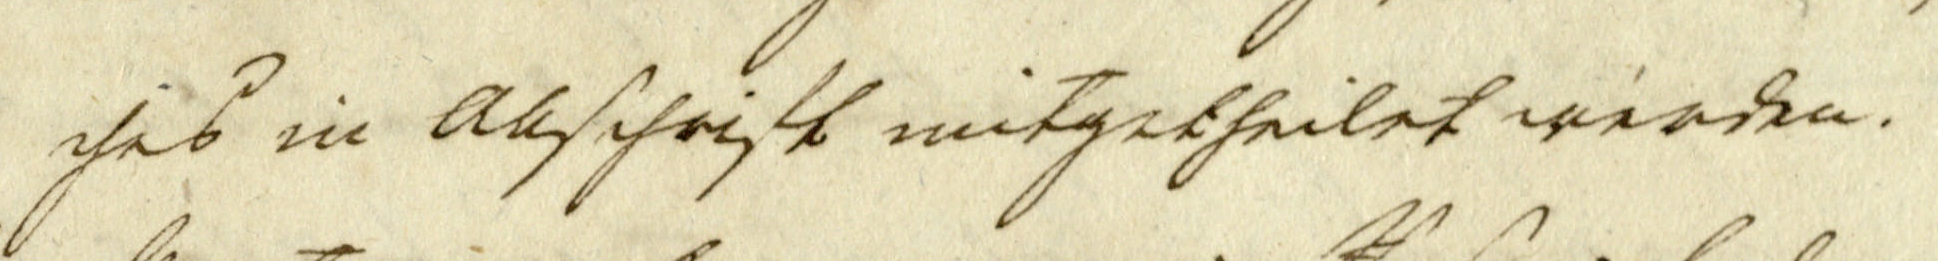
ches in Abschrift mitgetheilet werden.
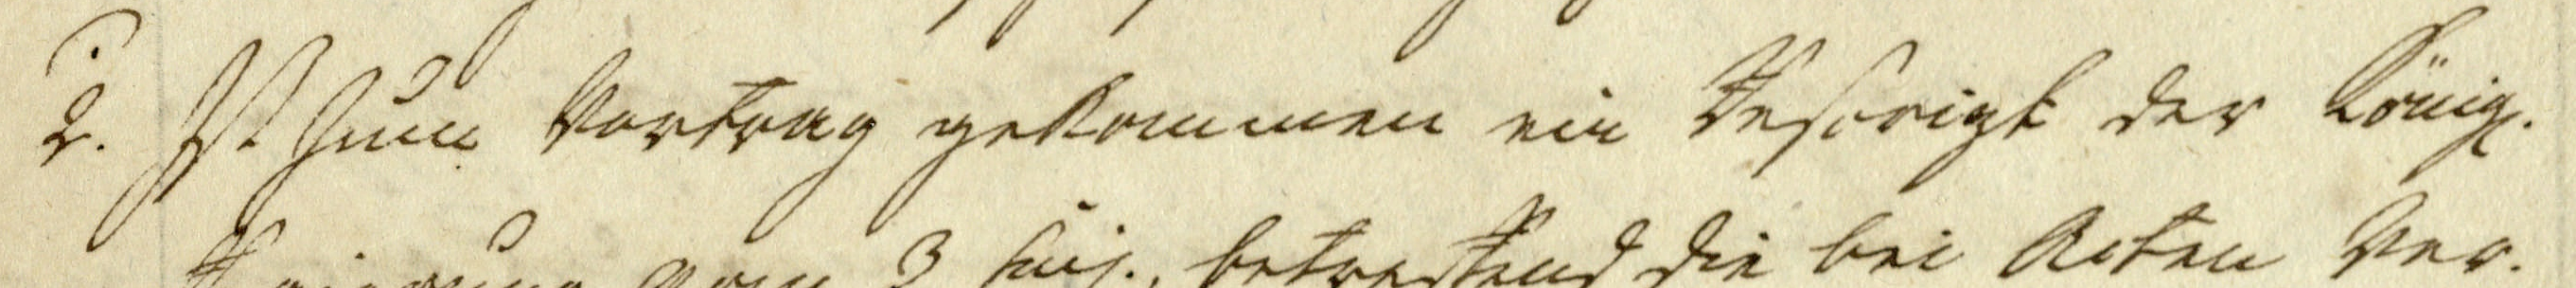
2. Ist zum Vortrag gekommen ein Rescript der Königl.
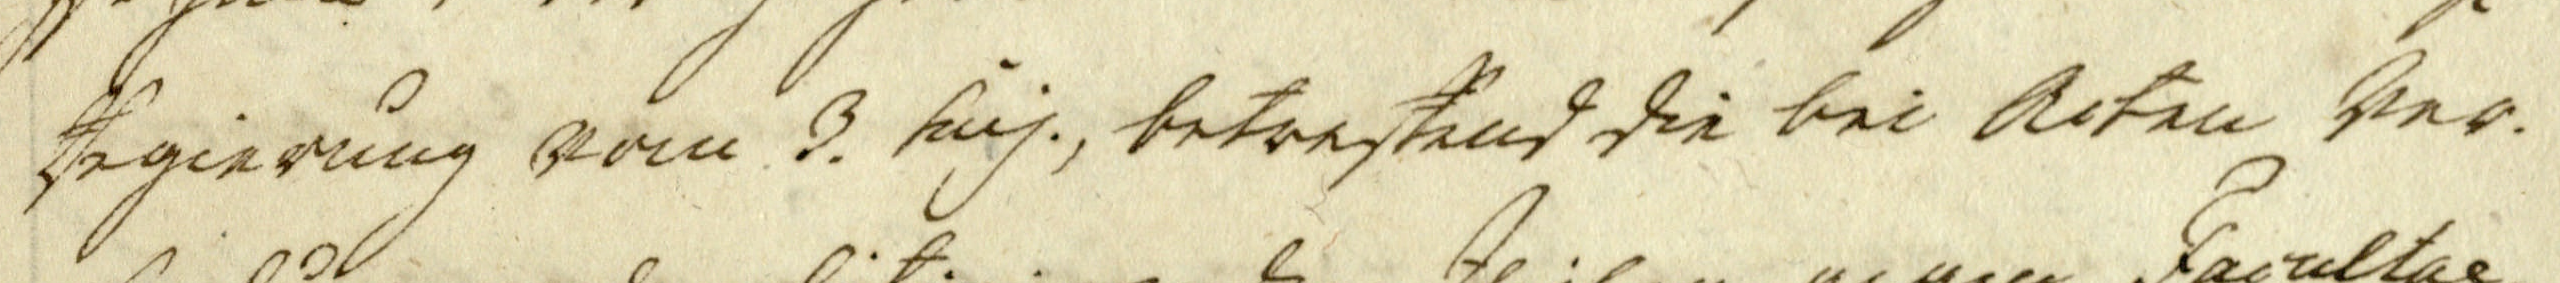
Regierung vom 3. huj., betreffend die bei Acten Ver¬
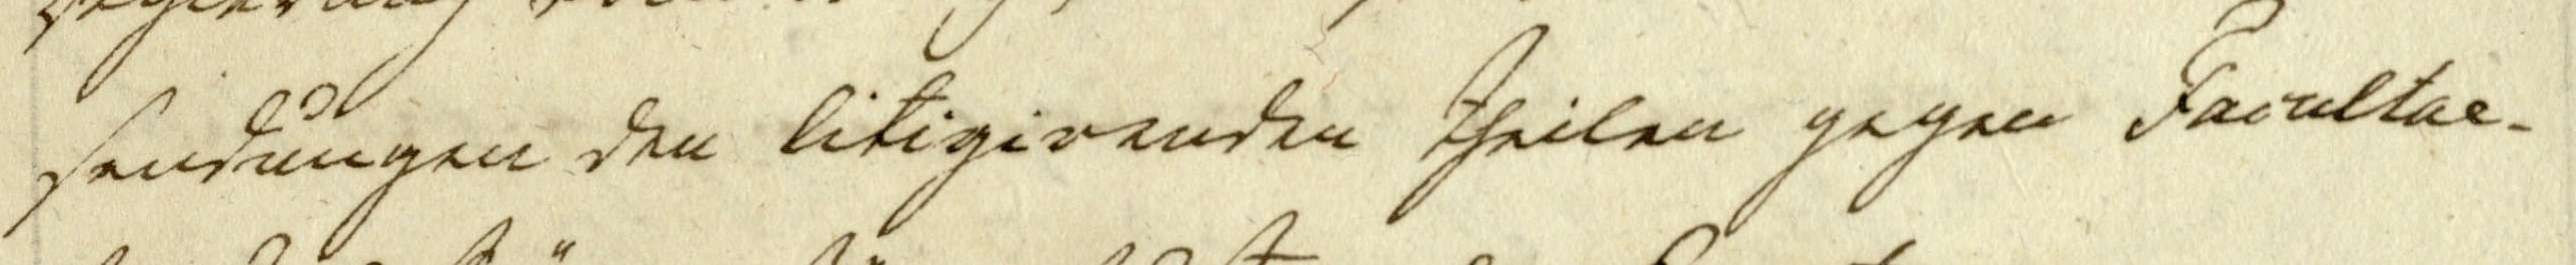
sendungen den litigirenden Theilen gegen Facultae¬
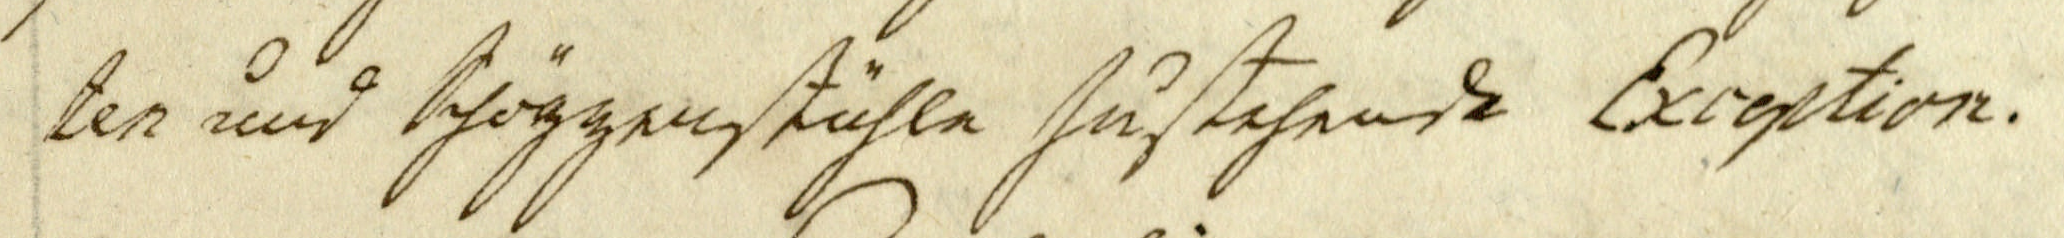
ten und Schöppenstühle zustehende Exception.
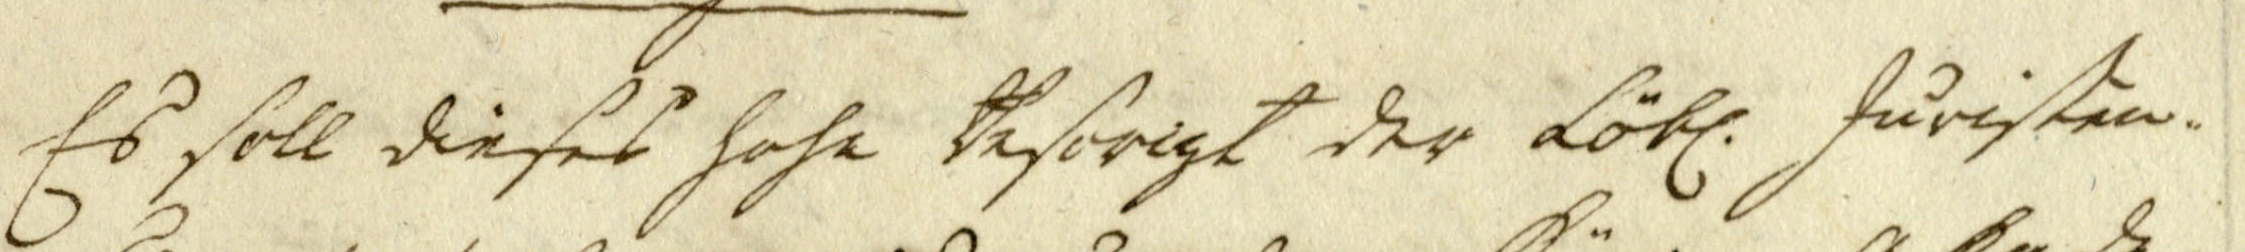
Es soll dieses hohe Rescript der Löbl. Juristen¬
